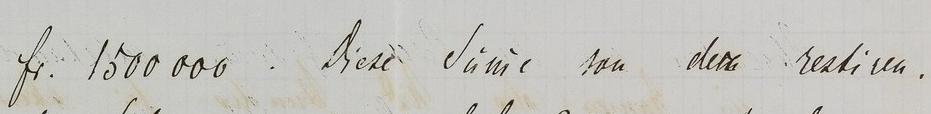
fr. 1 500 000. Diese Summe von der restiren-
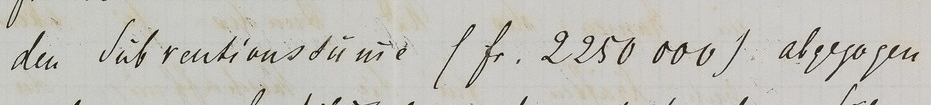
den Subventionssumme (fr. 2 250 000) abgezogen
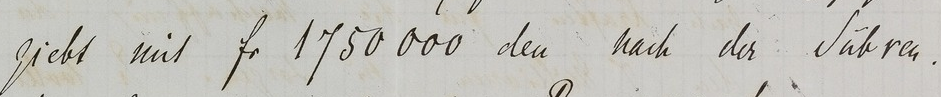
giebt mit fr. 1 750 000 den nach der Subven-
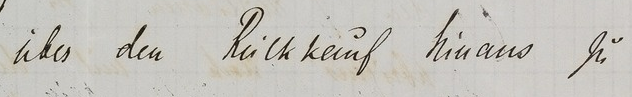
über den Rückkauf hinaus zu
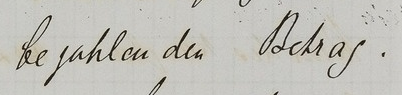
bezahlenden Betrag.
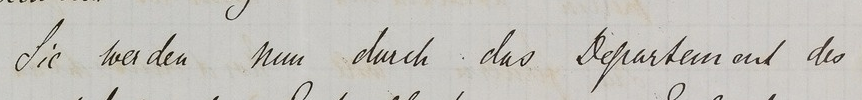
Sie werden nun durch das Departement des
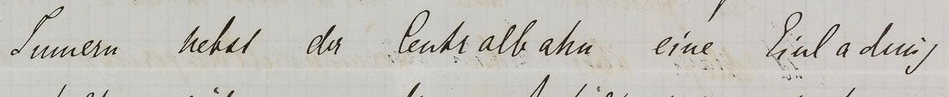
Innern nebst der Centralbahn eine Einladung
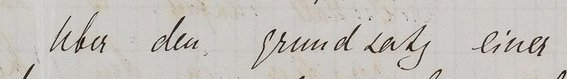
Über den Grundsatz einer
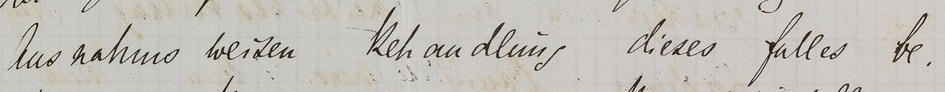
ausnahmsweisen Behandlung dieses Falles be-
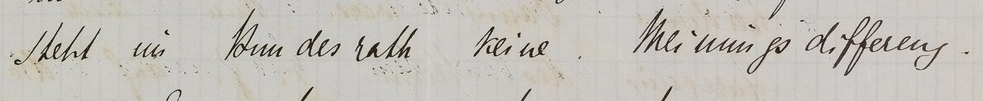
steht im Bundesrath keine Meinungsdifferenz.
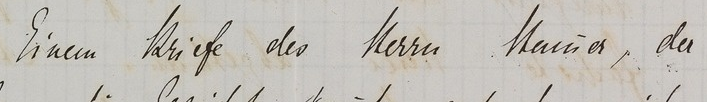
Einem Briefe des Herrn Hammer, der
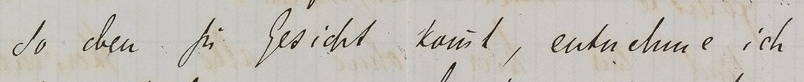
so eben zu Gesicht kommt, entnehme ich
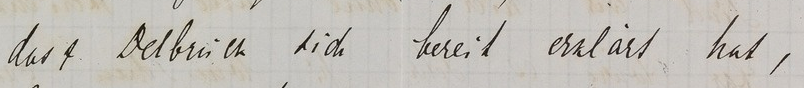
dass Delbrück sich bereit erklärt hat,
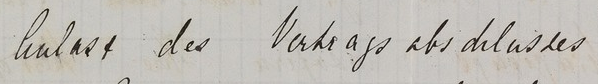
Anlass des Vertragsabschlusses
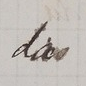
über
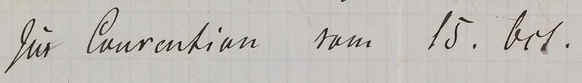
zur Convention vom 15. Oct.
